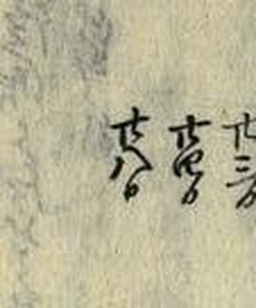廿九日
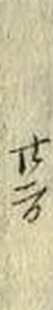廿九日
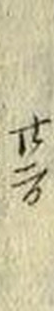廿九日
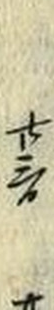廿九日
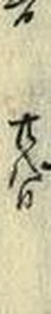廿九日
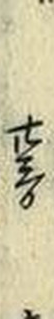廿九日
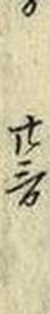廿九日
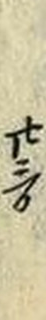廿九日
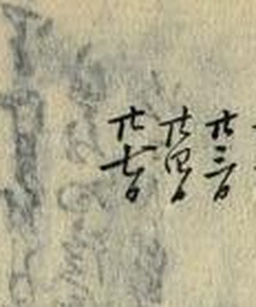廿九日
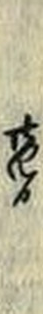廿九日
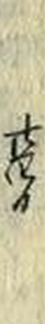廿九日
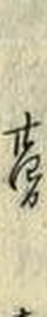廿九日
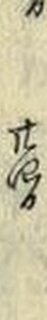廿九日
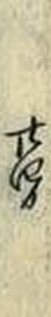廿九日
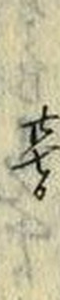廿九日
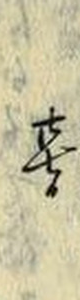廿九日
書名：少傅日録抄（斉承付側向頭取日記、在国）
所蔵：福井県文書館 Fukui Prefectural Archives
